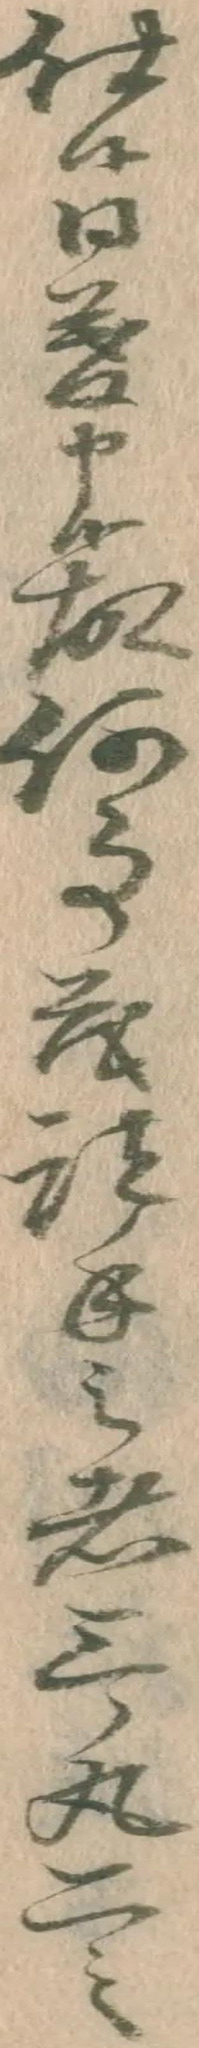仕候日暮申候故何事茂諸手之者三之二之
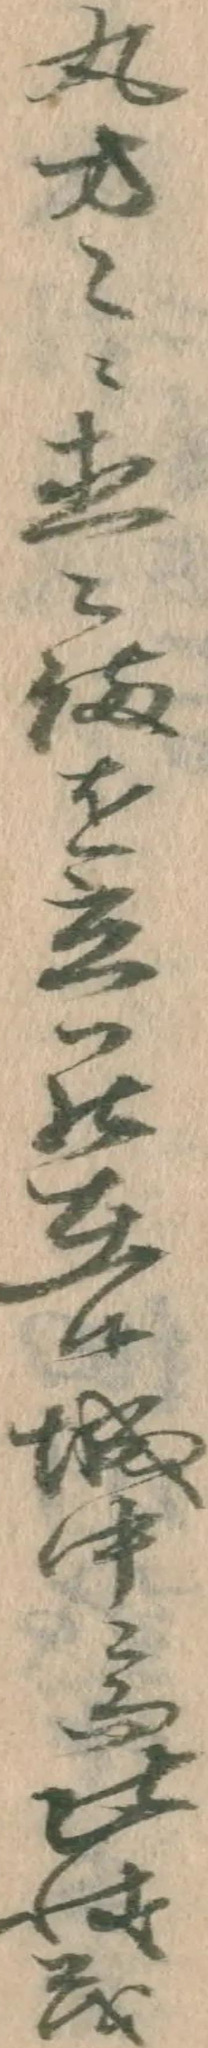丸方々に直に備を立罷在候城中に而此状茂
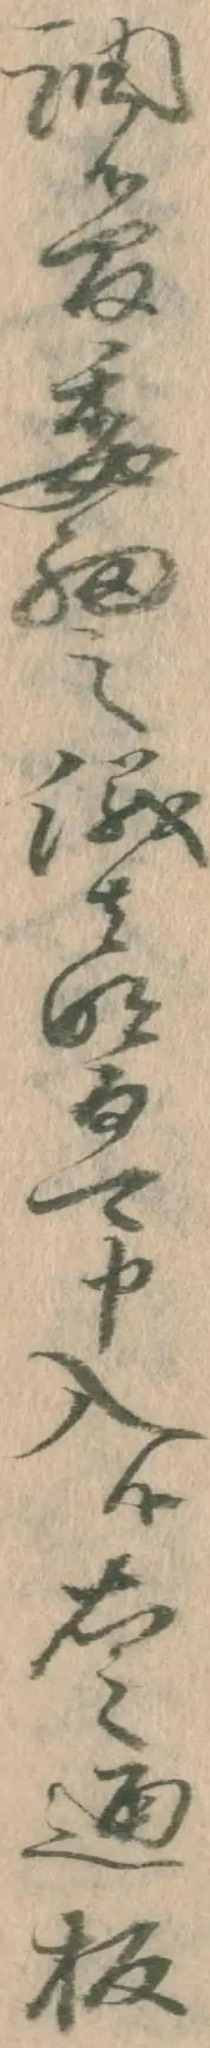調候間委細之儀者明日可申入候右之通板
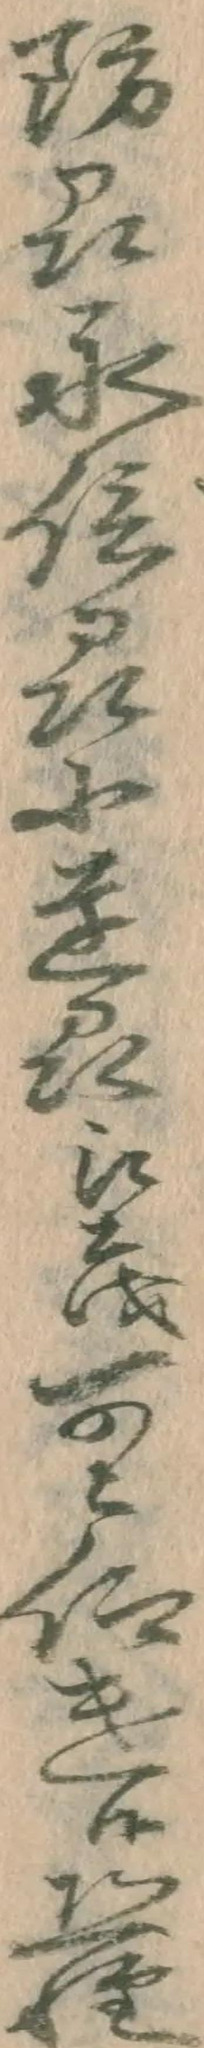防州承信州小遠州江茂可被仰遣候恐惶
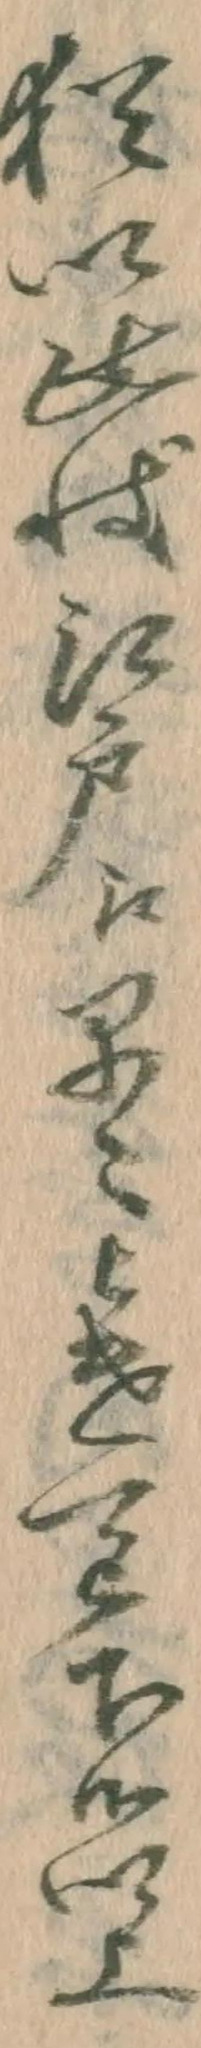猶以此状江戸江早々被遣可被下候以上
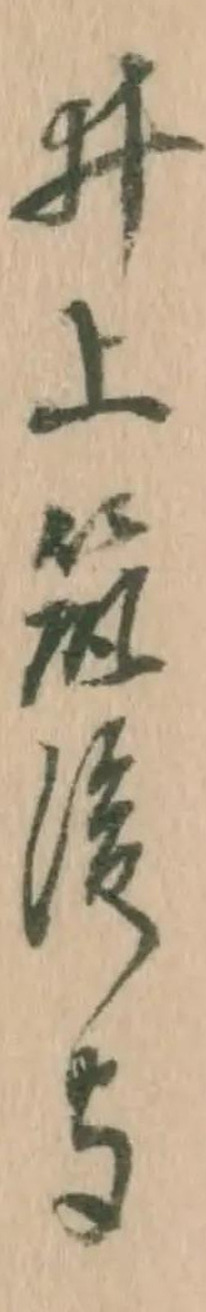井上筑後守
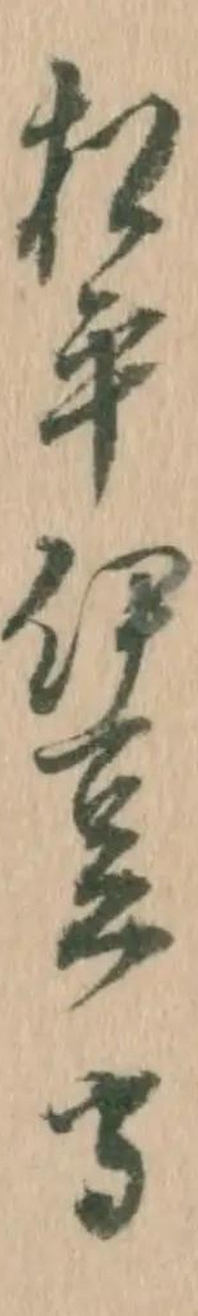松平伊豆守
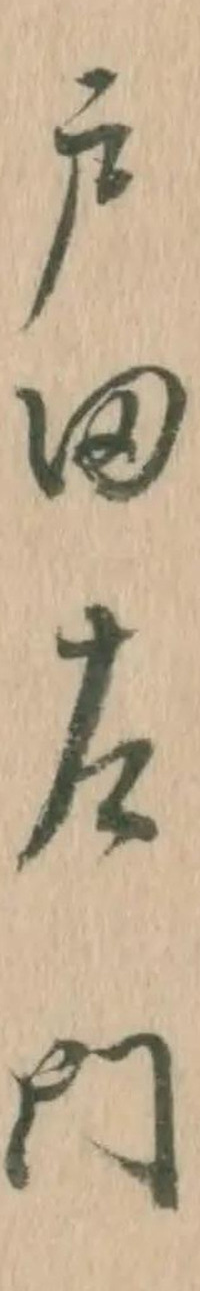戸田左門
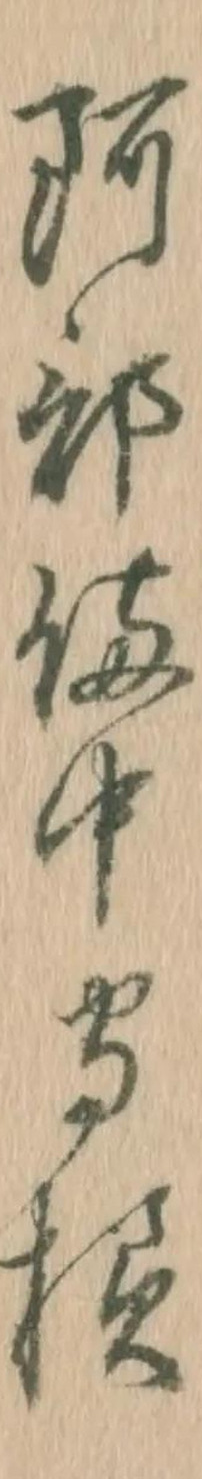阿部備中守様
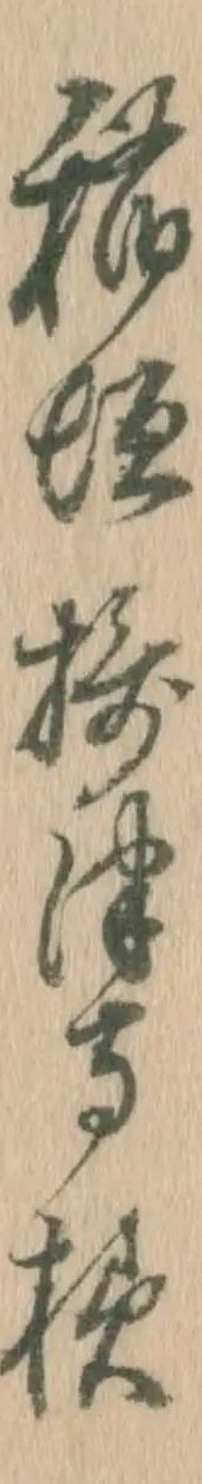稲垣摂津守様
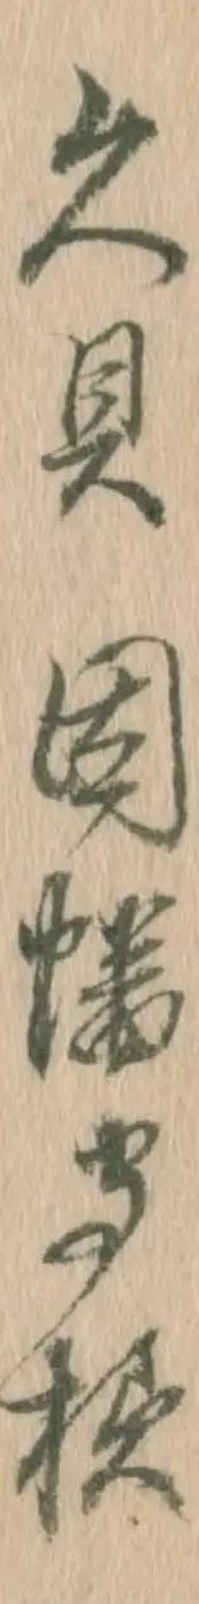久貝因幡守様
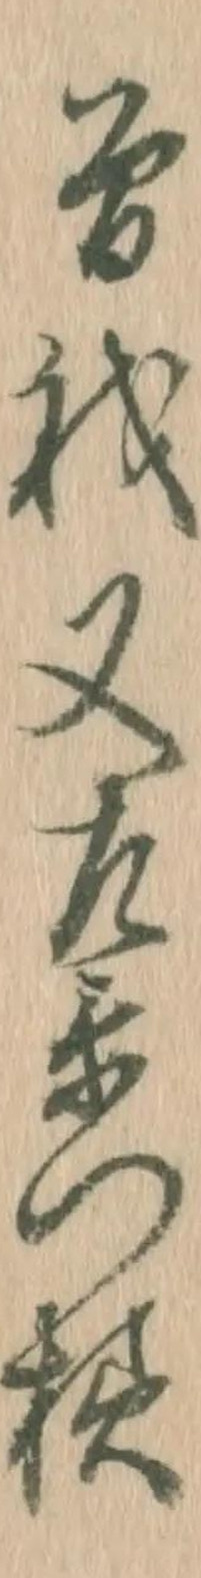曽我又左衛門様

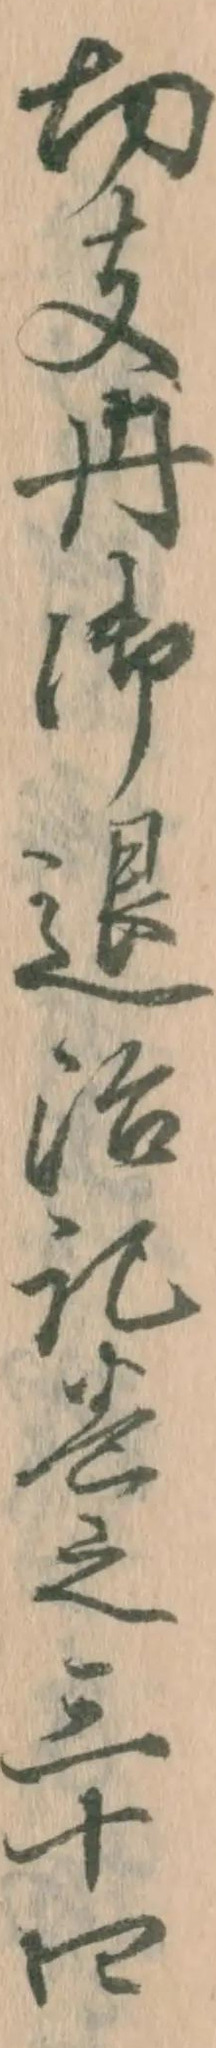切支丹御退治記巻之三十四
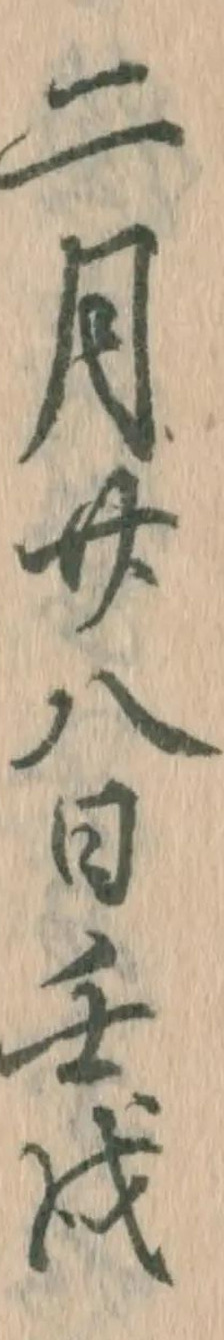二月二十八日壬戌
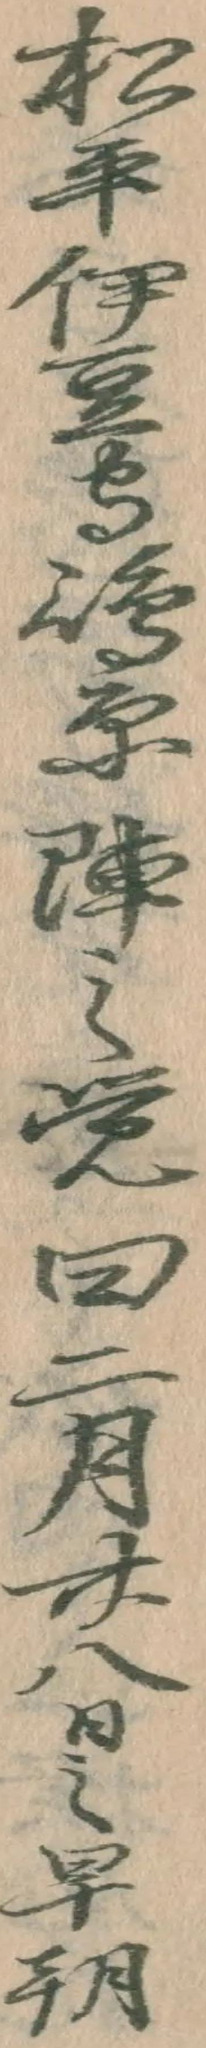松平伊豆守島原陣之覚曰二月廿八日之早朝
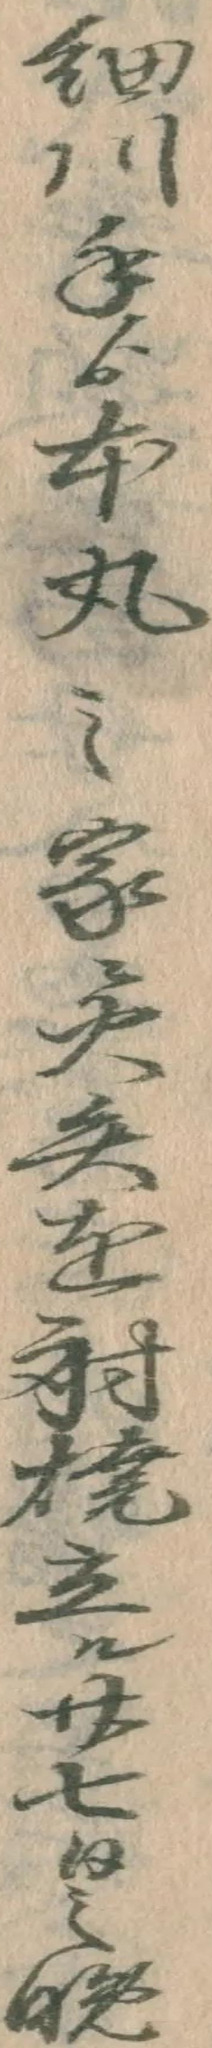細川手ゟ本丸之家に火矢を射焼立る廿七日之晩
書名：切支丹御退治記 49巻. [8]
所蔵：国立国会図書館 National Diet Library, JAPAN
